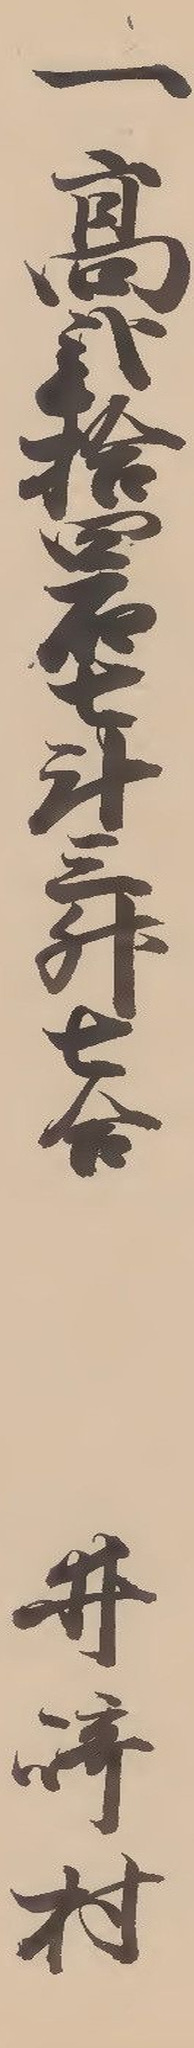一高弐拾四石七斗三升七合井崎村
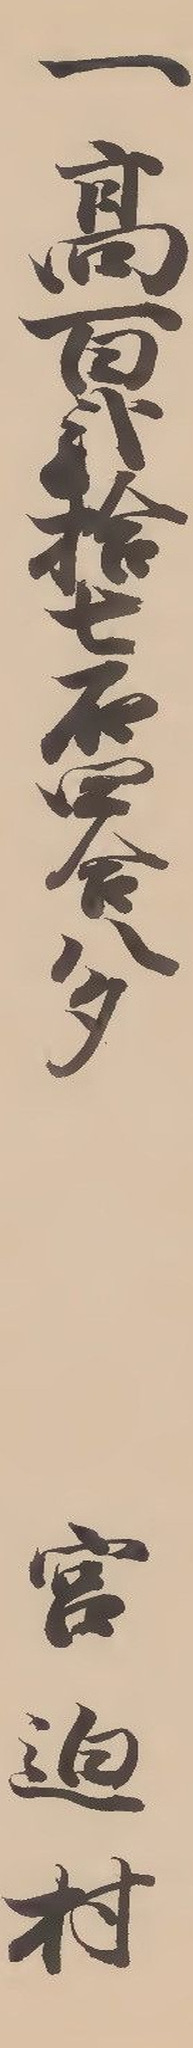一高百弐拾七石四合八勺宮迫村
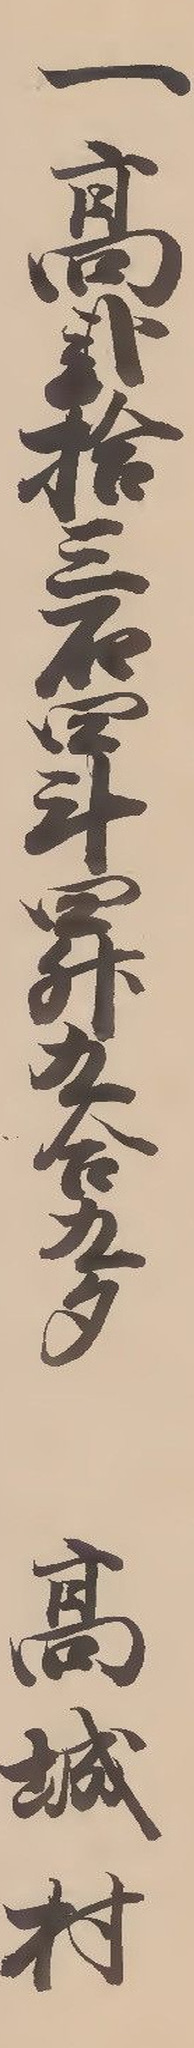一高弐拾三石四斗四升九合九勺高城村
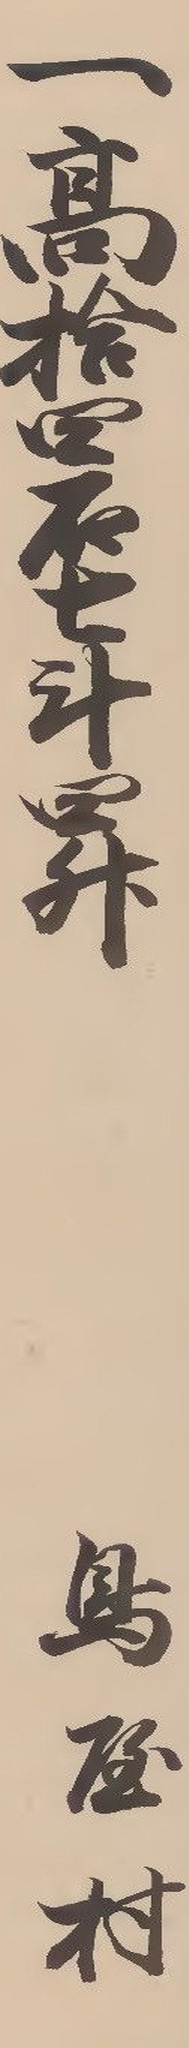一高拾四石七斗四升鳥屋村
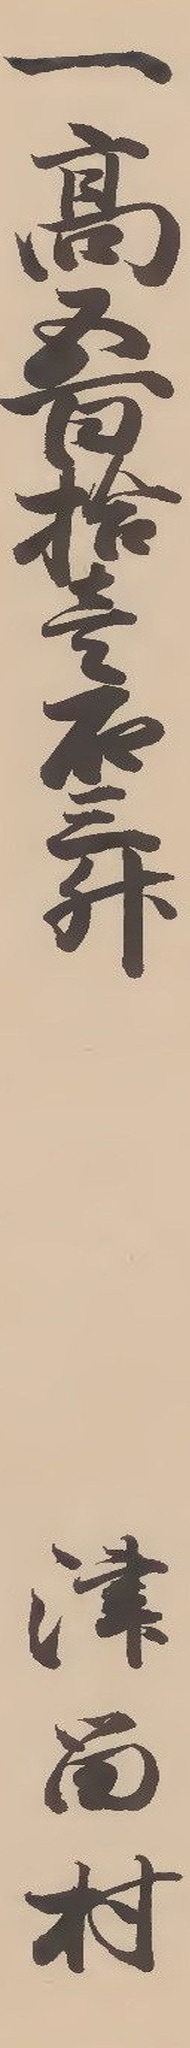一高五百拾壱石三升津留村
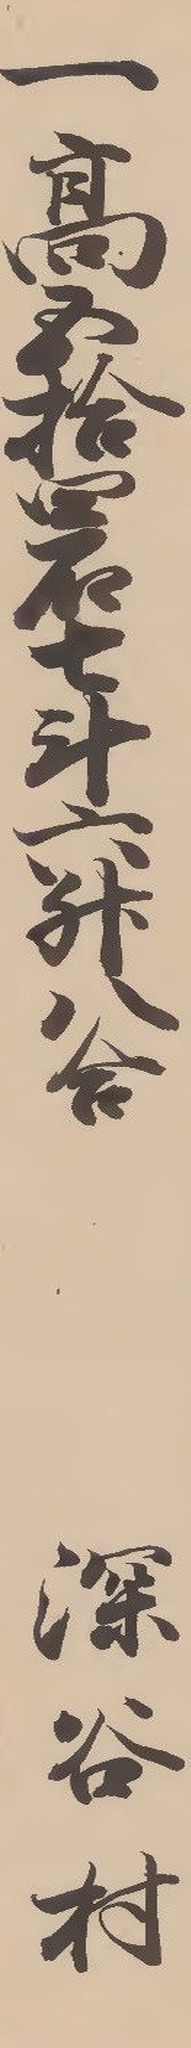一高五拾四石七斗六升八合深谷村
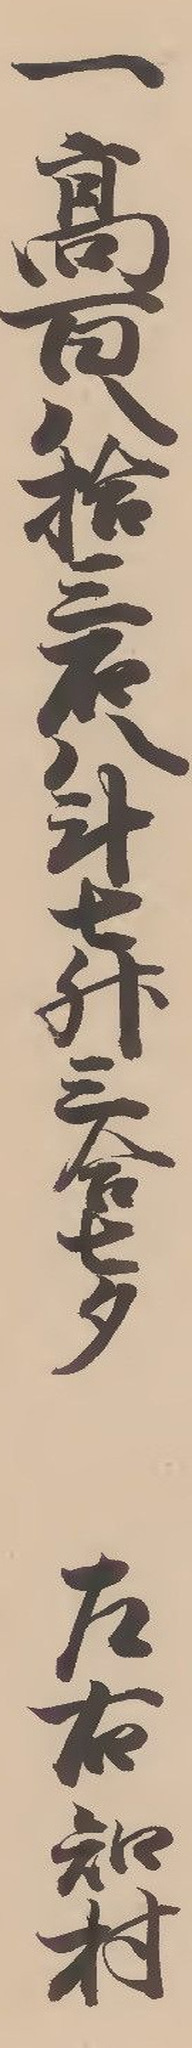一高百八拾三石八斗七升三合七勺左右知村

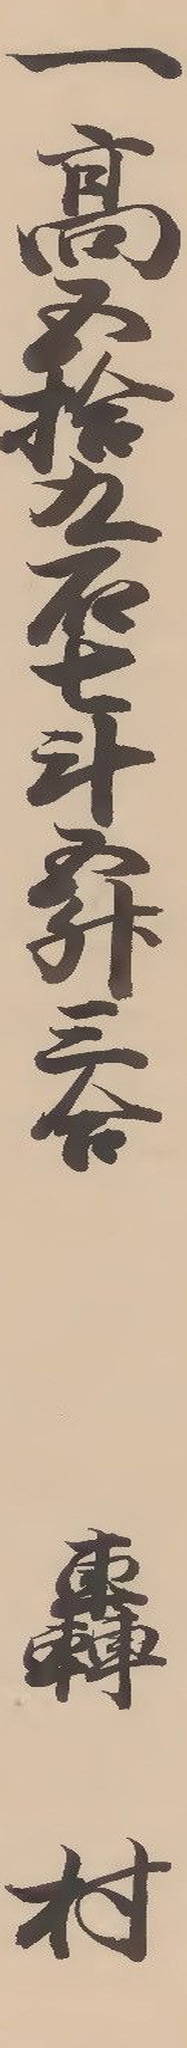一高五拾九石七斗五升三合轟村
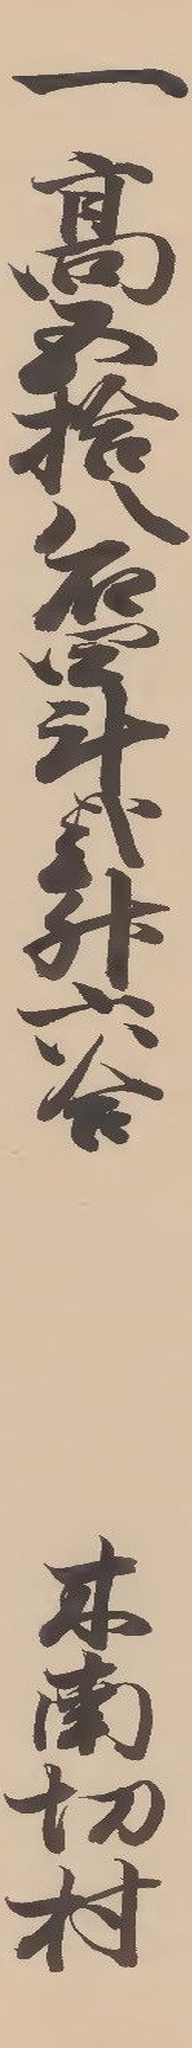一高五拾八石四斗弐升六合木南切村
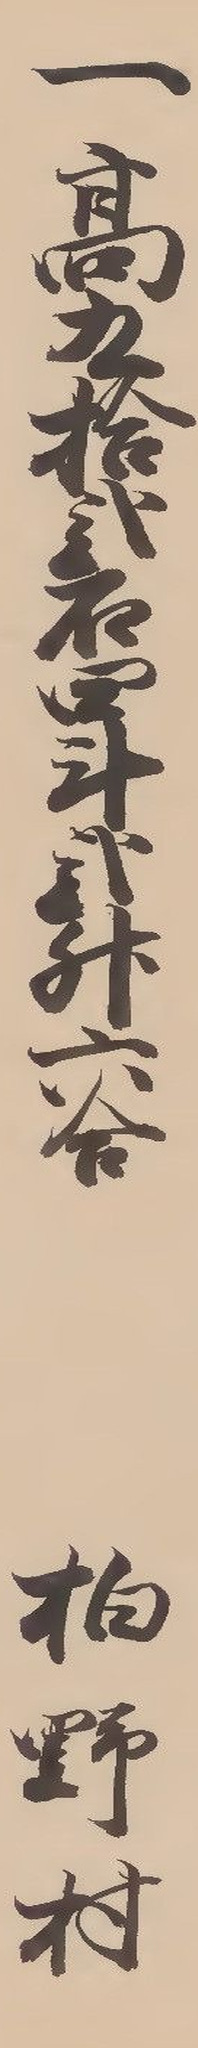一高九拾弐石四斗弐升六合柏野村
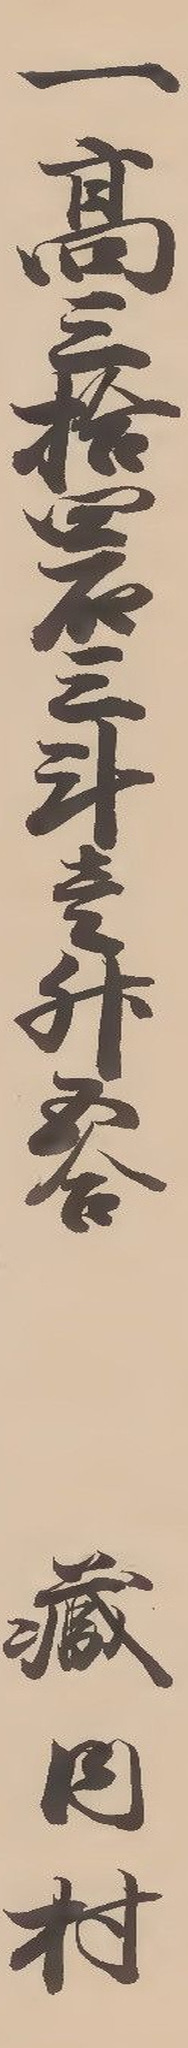一高三拾四石三斗壱升五合蔵内村
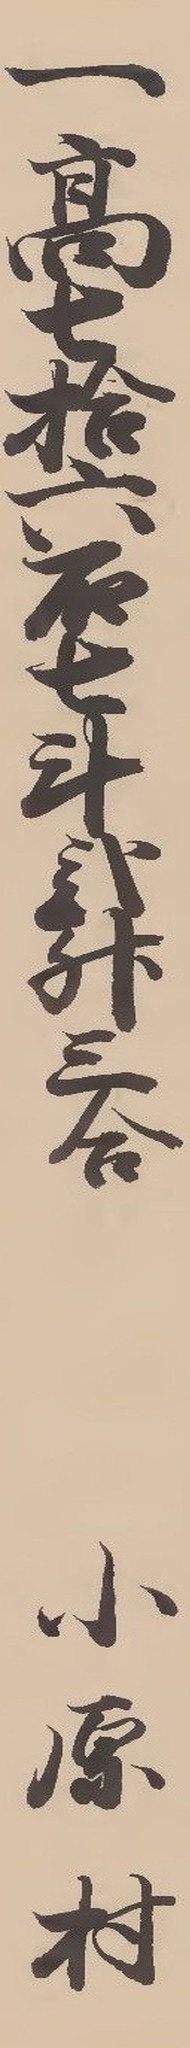一高七拾六石七斗弐升三合小原村
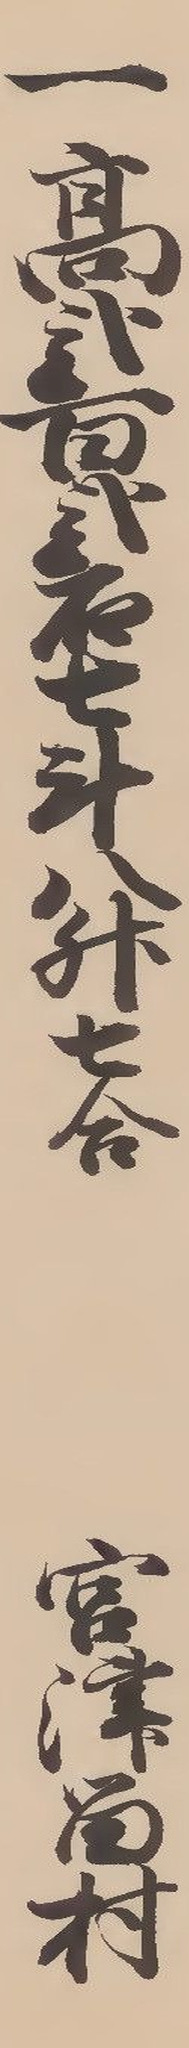一高弐百弐石七斗八升七合宮津留村
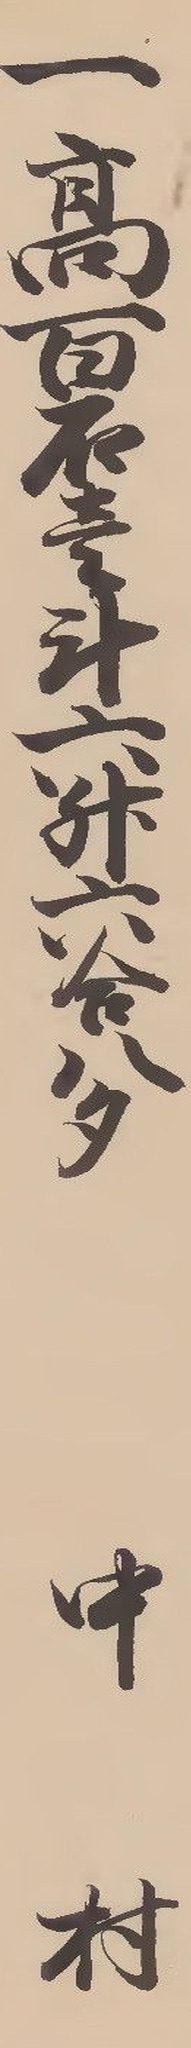一高百石壱斗六升六合八勺中村
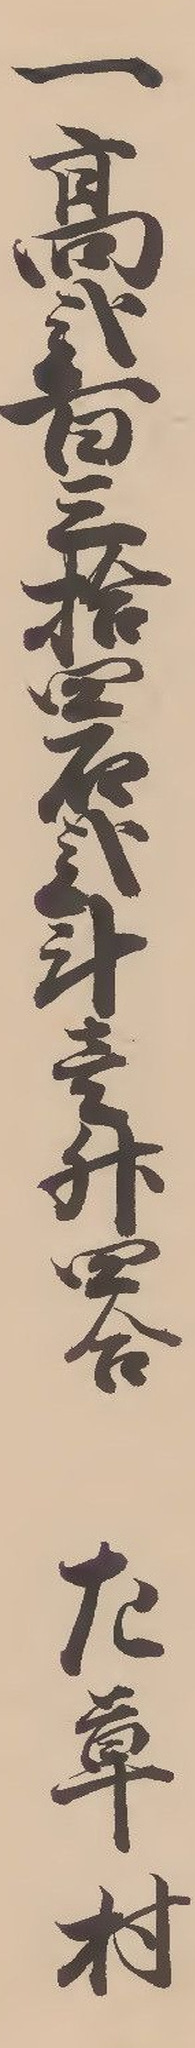一高弐百三拾四石弐斗壱升四合左草村

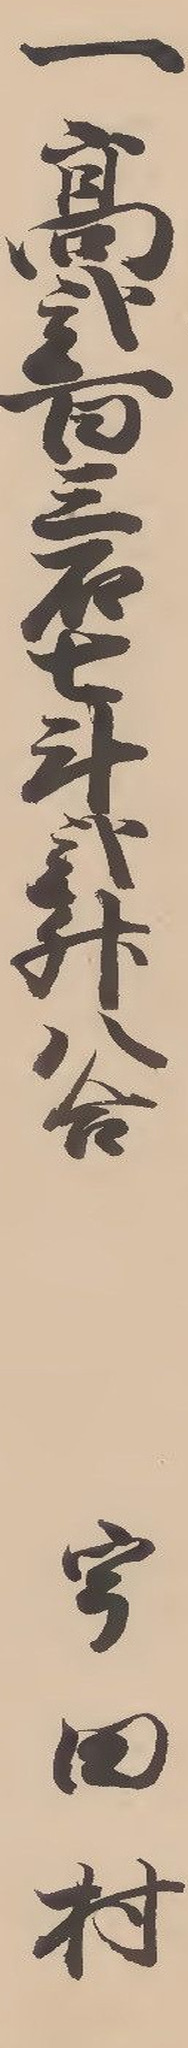一高弐百三石七斗弐升八合宇田村
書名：豊後国郷帳
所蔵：国立公文書館 National Archives of Japan
